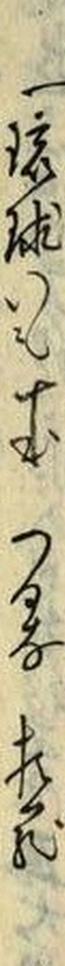琉球いも十本つるな拾籠
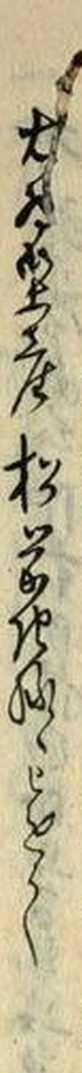右為御土産松栄院様へ被進之
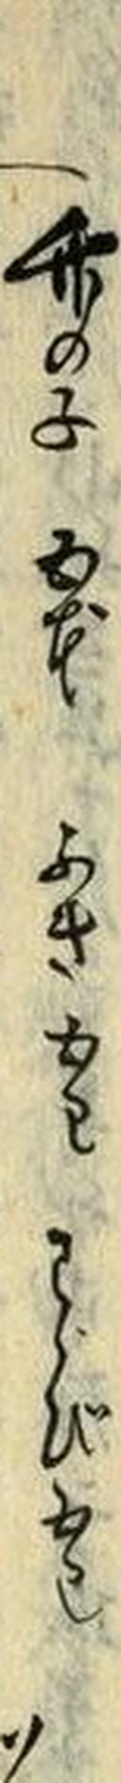竹の子五本ふき五わわらび五わ
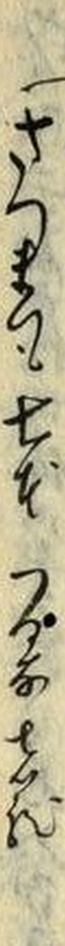さつまいも七本つるな十籠ツヽ
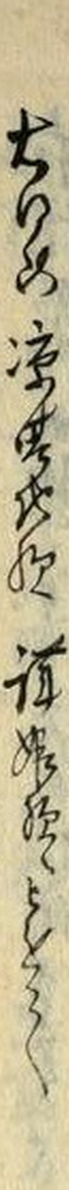右同断涼晴院様謹姫様へ被進之
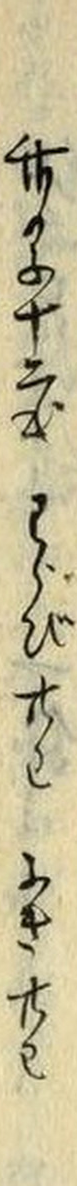竹の子十二本わらび廿わふき廿わ
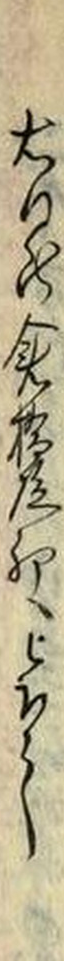右同断倉橋殿初へ被下之
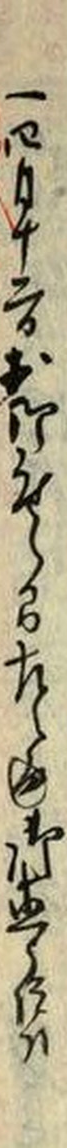四月十二日於御座之間左之通御直被仰付
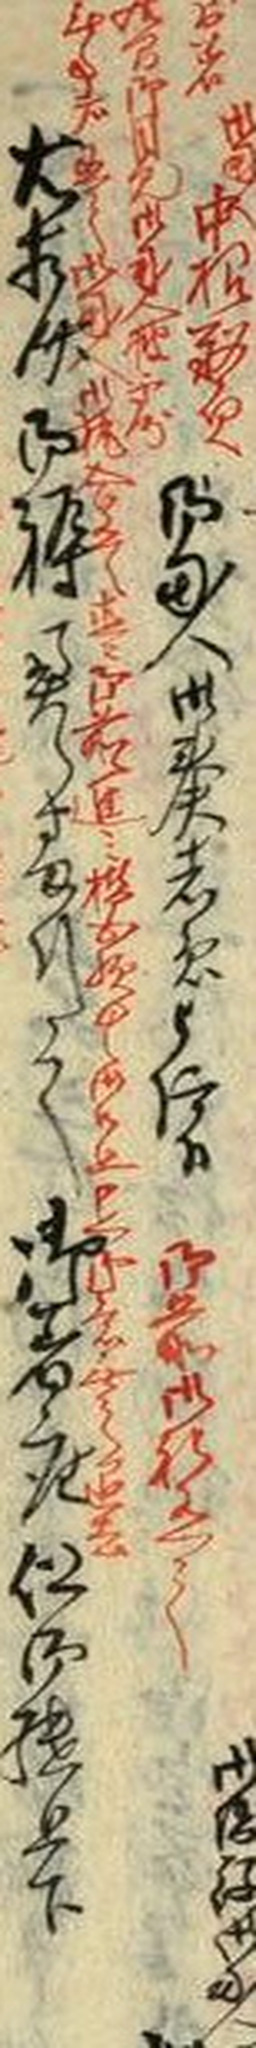右相済御褥奥之番引之御着座但御継上下
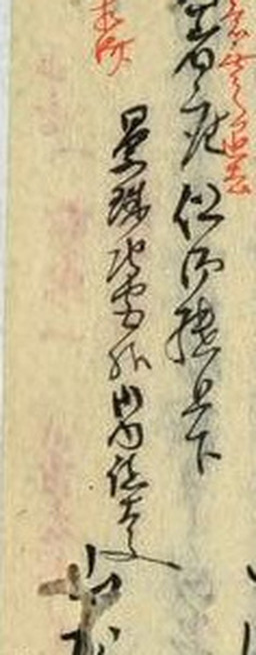曼珠院宮様御内役太夫

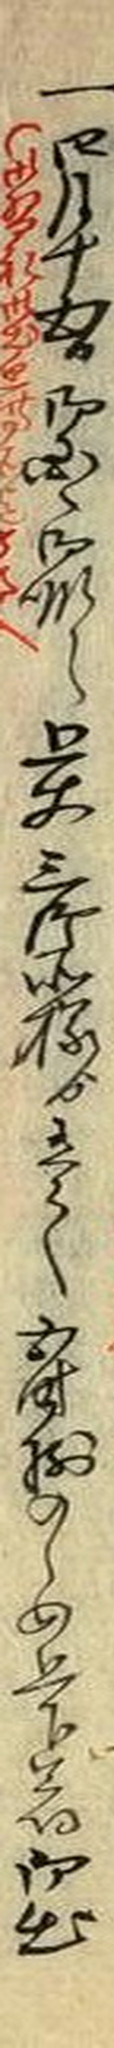一四月十五日御国へ御暇之上使三御所様ゟ有之五時揃のしめ上下着御出
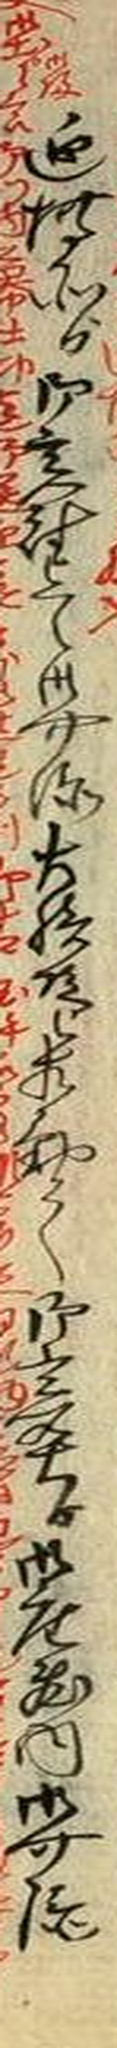迎場所ゟ御玄冠迄御介添左膳殿被相勤之御玄関ゟ御屋敷内御介添
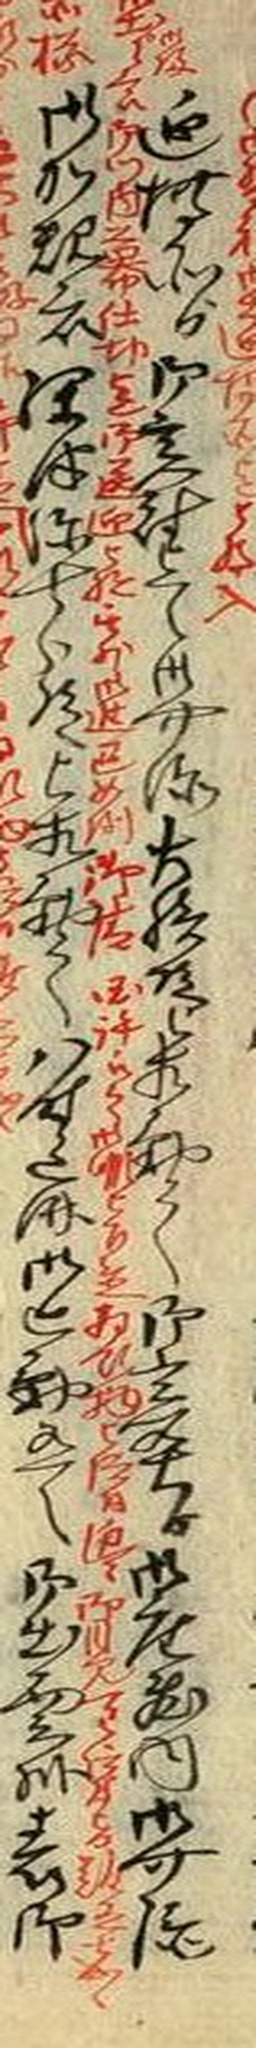御加規衆深津弥十郎殿被相勤之八時過済御廻勤有之御出殿掛表御
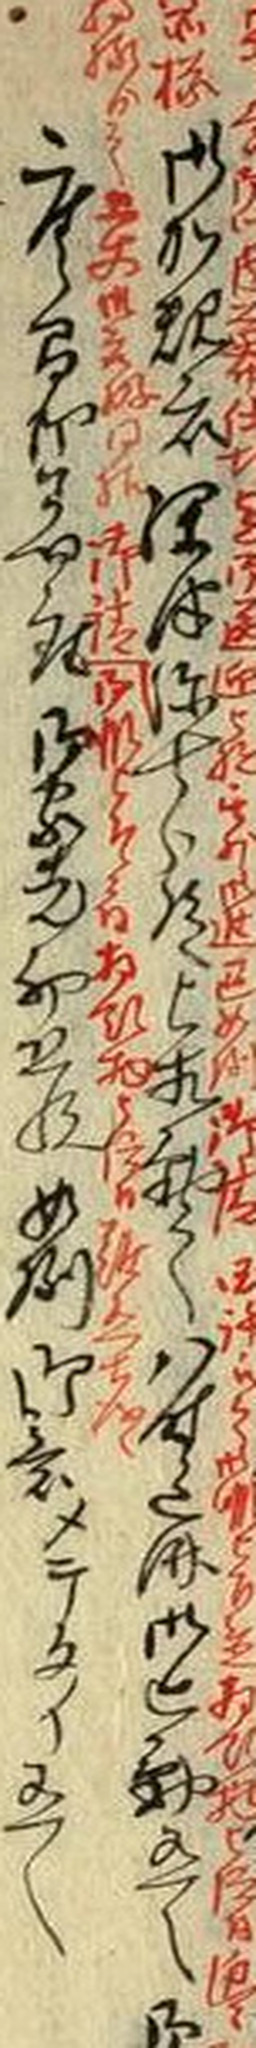座之間御着座御家老初恐悦如例御意メテタイ有之
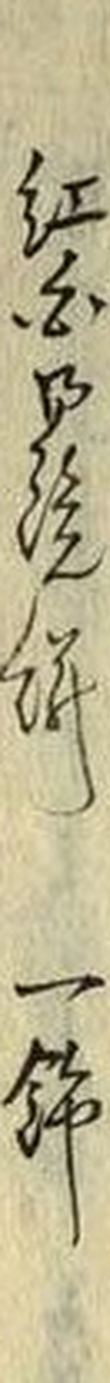紅白御鏡餅一飾
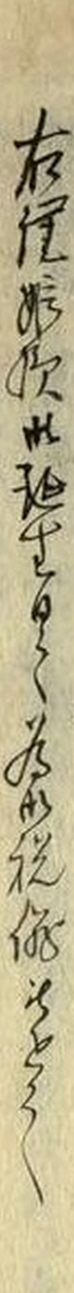右謹姫様御誕生日之為御祝儀被進之
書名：少傅日録抄（斉善付側向頭取日記、江戸并道中、初入在国、逝去後…
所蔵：福井県文書館 Fukui Prefectural Archives
